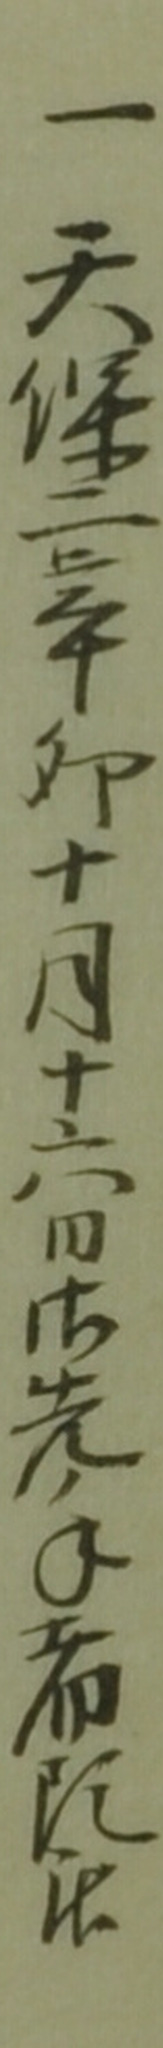一天保二辛卯十月十六日御先手者頭被
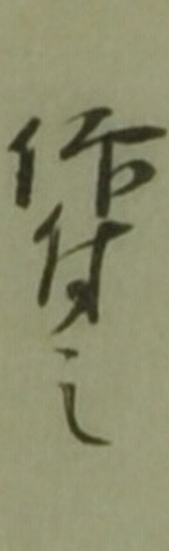仰付之
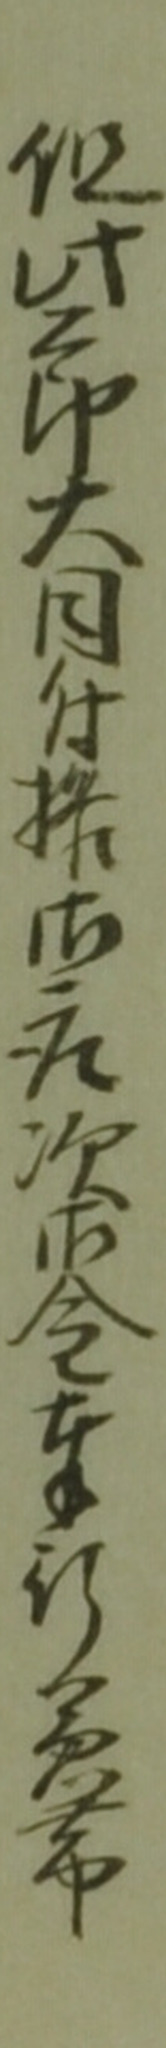但此節大目付格御取次御金奉行兼帯
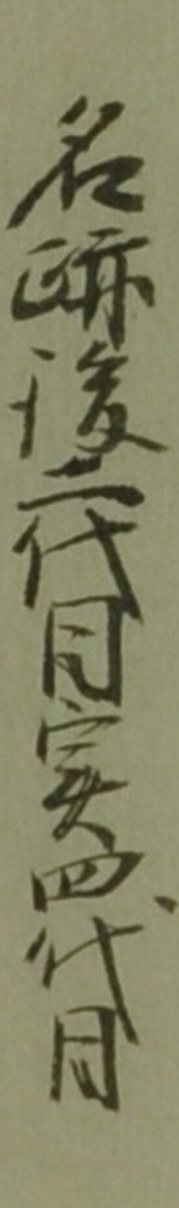名跡後二代目実四代目
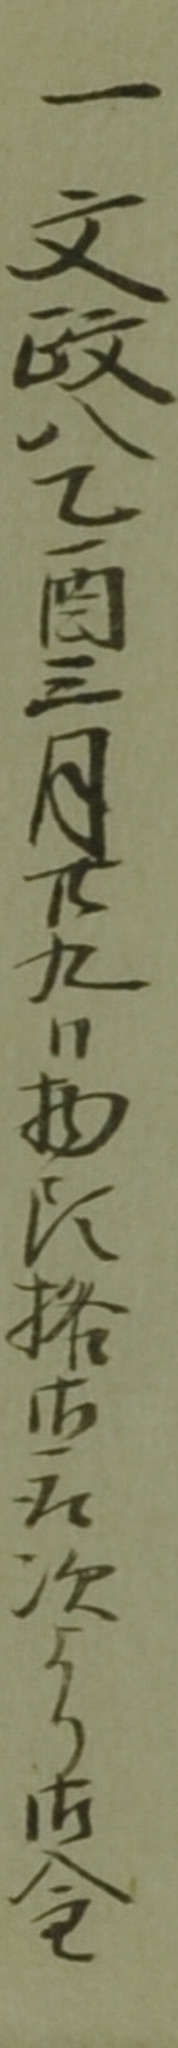一文政八乙酉三月廿九日物頭格御取次より御金
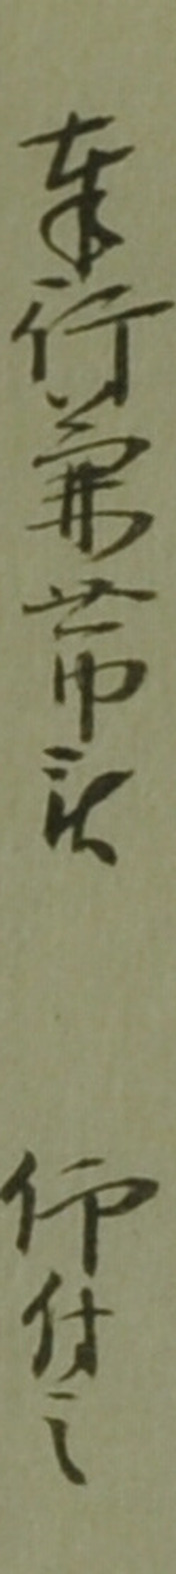奉行兼帯被仰付之
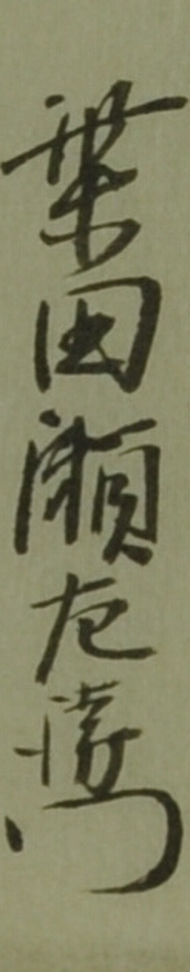柴田瀬左衛門
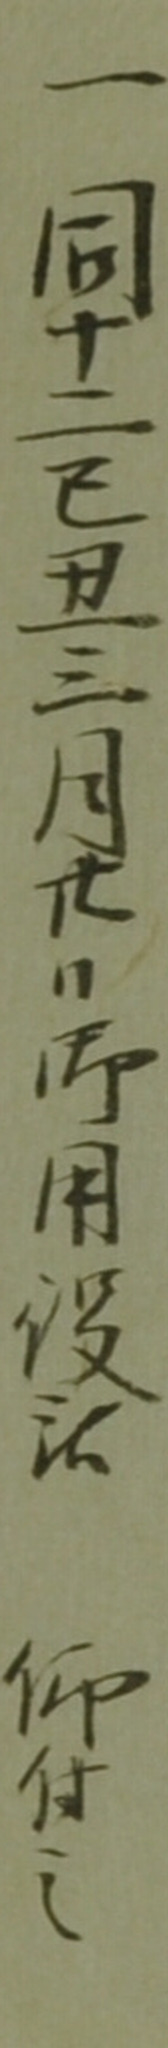一同十二己丑三月廿日御用役被仰付之
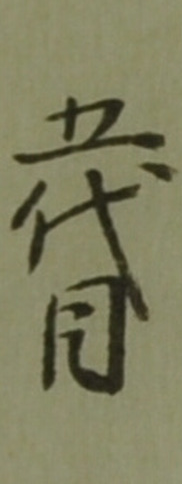五代目
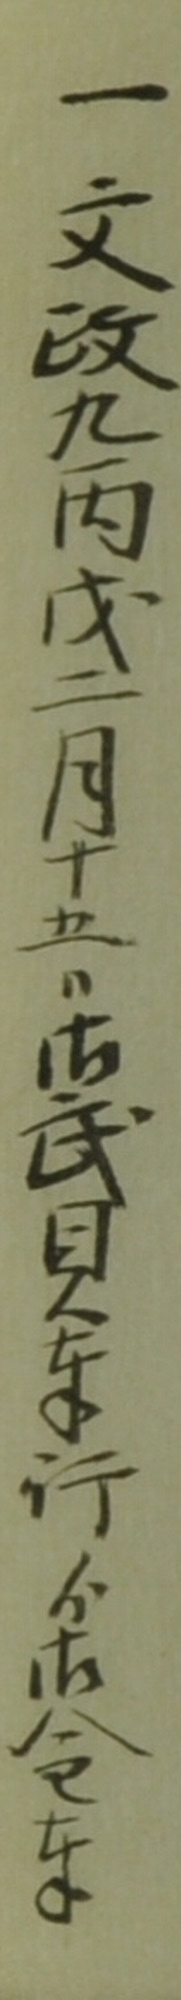一文政九丙戌二月十五日御武具奉行ゟ御金奉
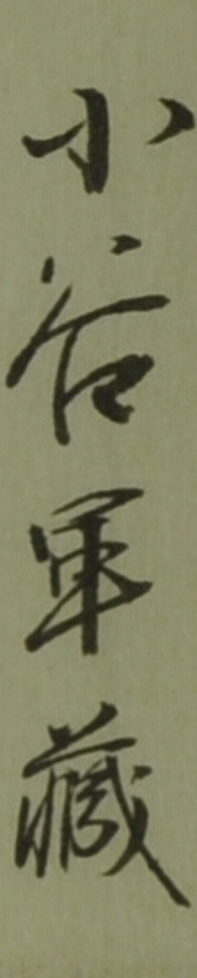小谷軍蔵

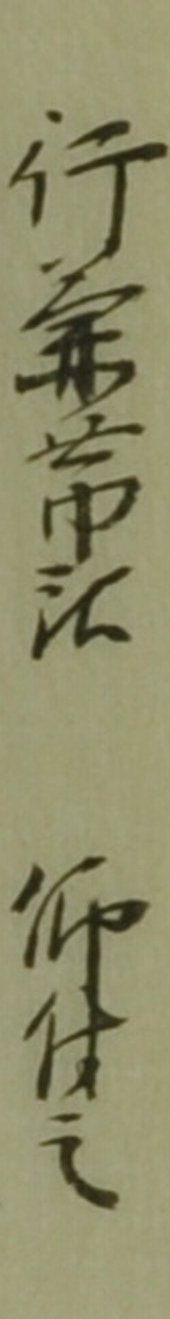行兼帯被仰付之
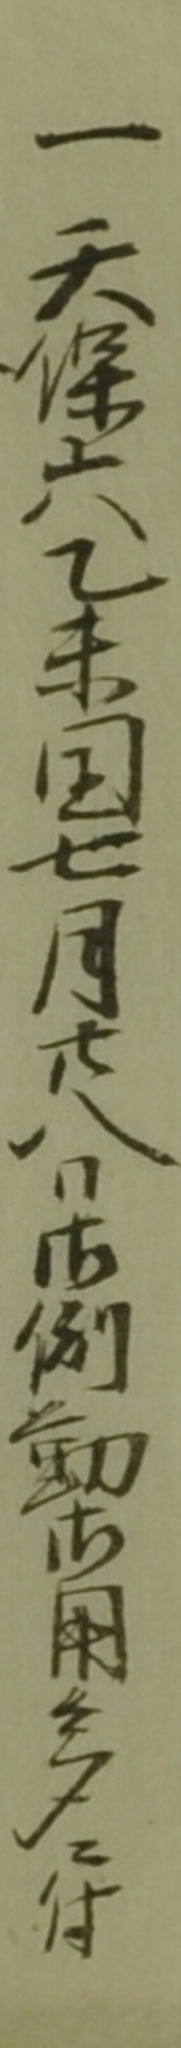一天保六乙未閏七月廿八日御側勤御用多付
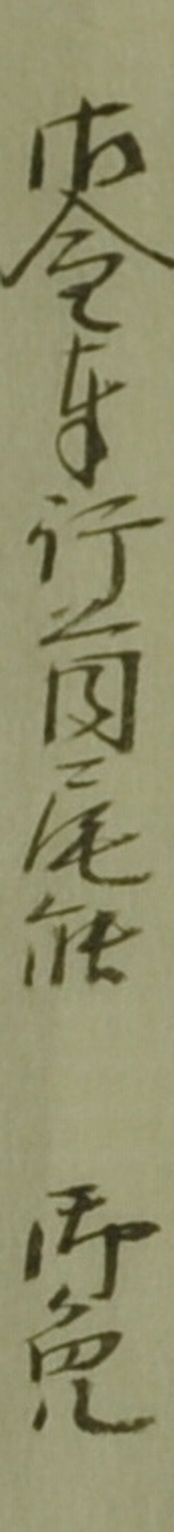御金奉行首尾能御免
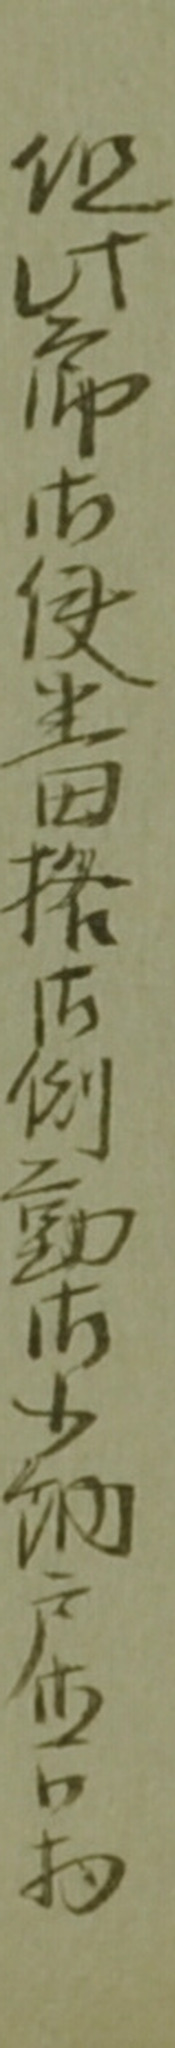但此節御使番格御側勤御小納戸御召物
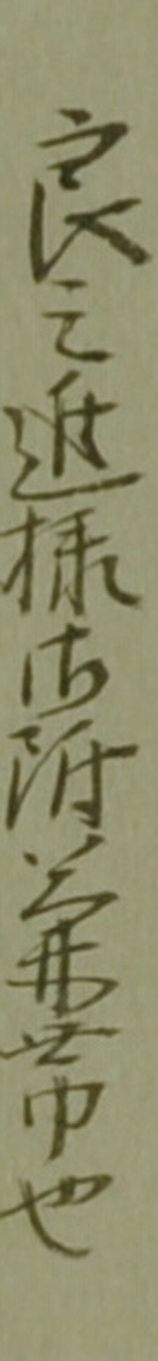良之進様御附兼帯也
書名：諸御役代々録（七）
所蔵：伊那市立高遠町図書館・合同会社AMANE
